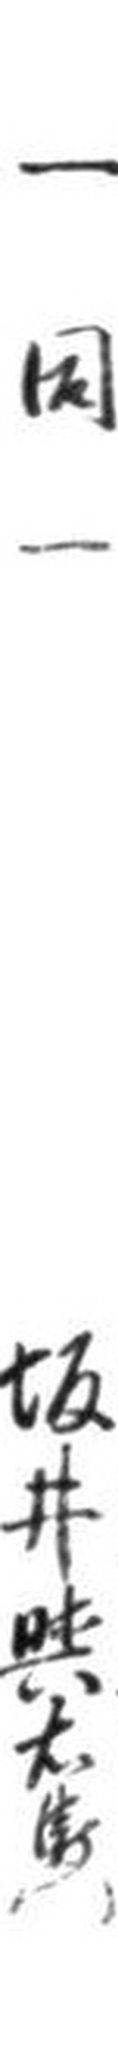一同一坂井与右衛門
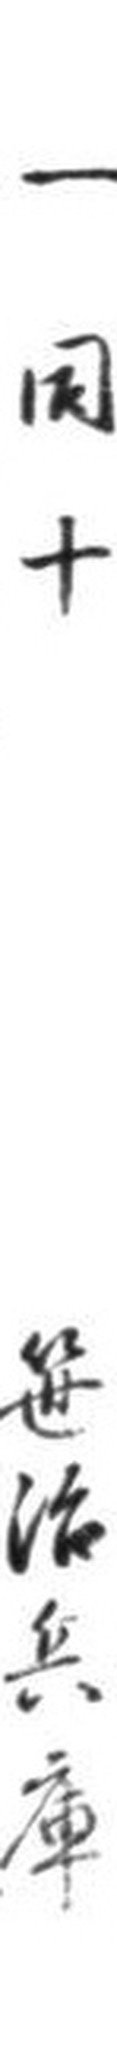一同十笹治兵庫
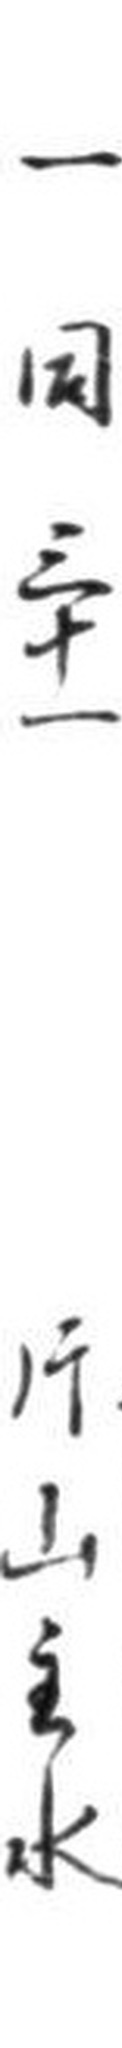一同三十一片山主水
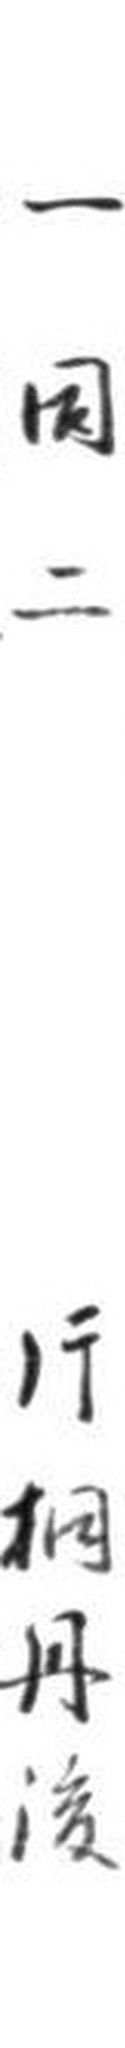一同二片桐丹後
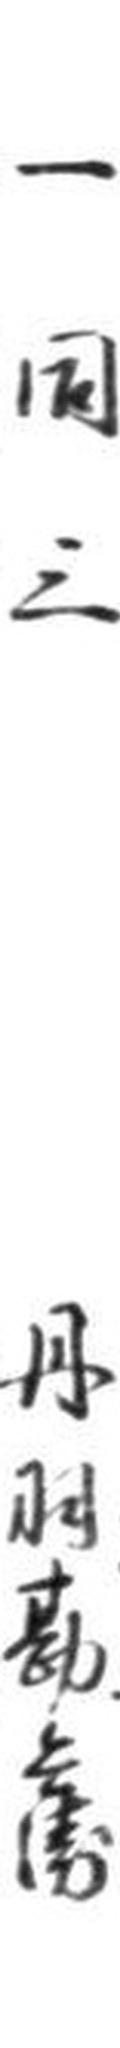一同三丹羽勘兵衛
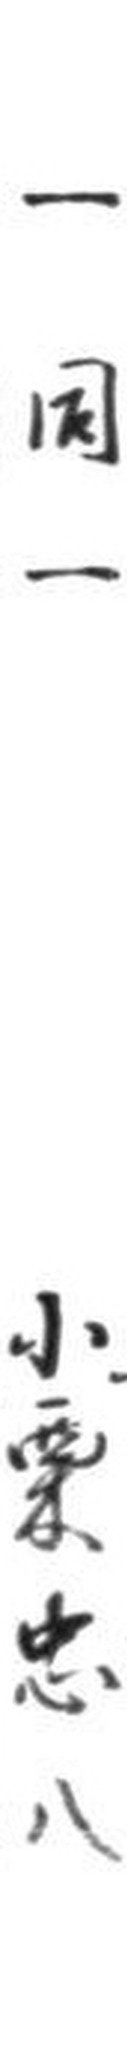一同一小栗忠八
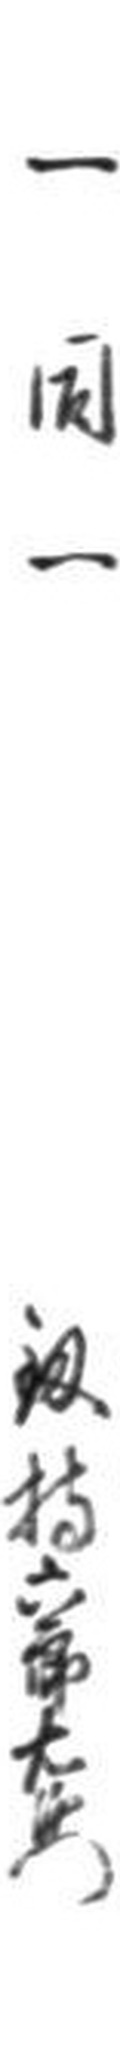一同一剣持六郎右衛門
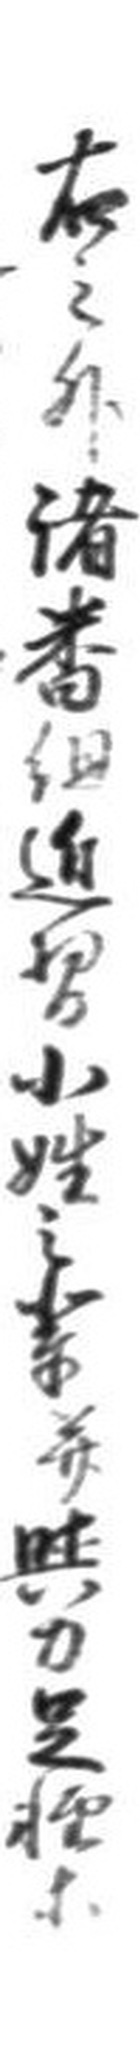右之外諸番組近習小姓之輩并与力足軽等
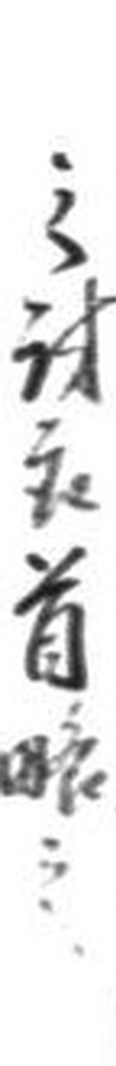之討取首略之
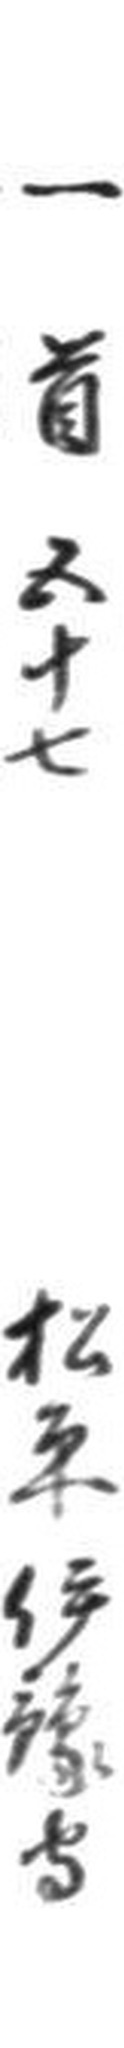一首五十七松平伊予守
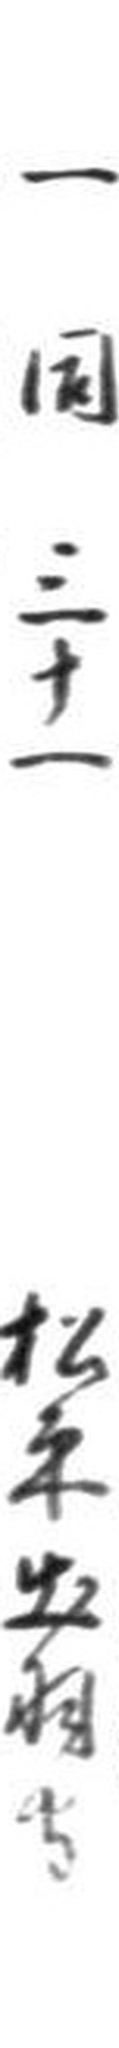一同三十一松平出羽守
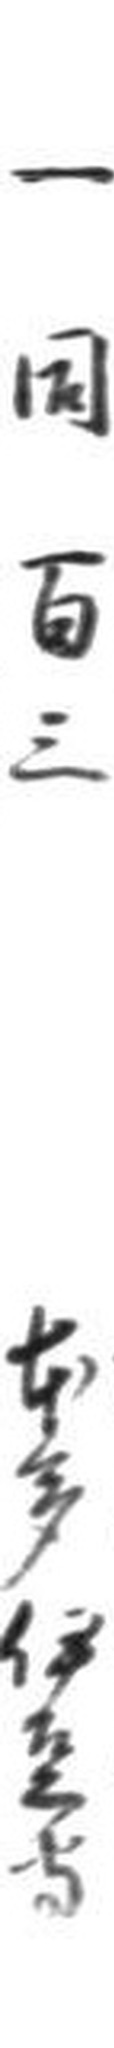一同百三本多伊豆守
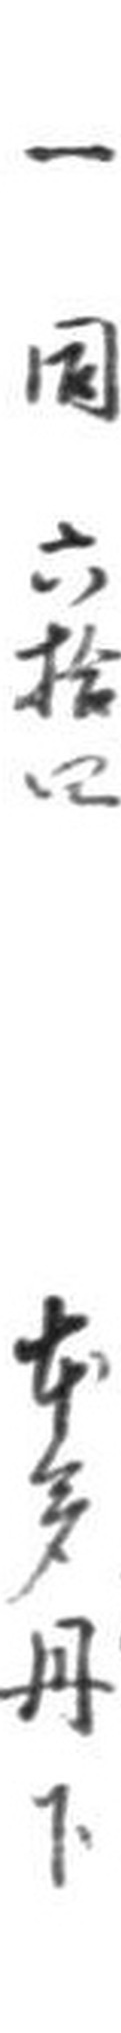一同六拾四本多丹下
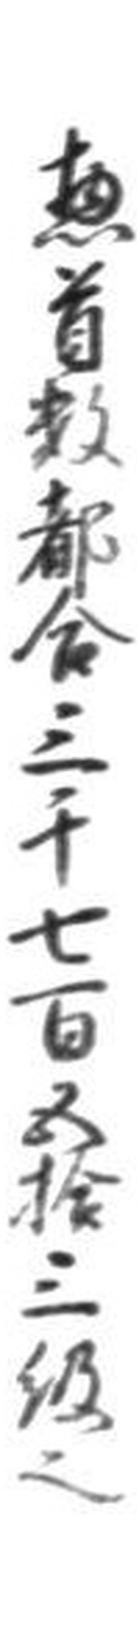惣首数都合三千七百五拾三級也
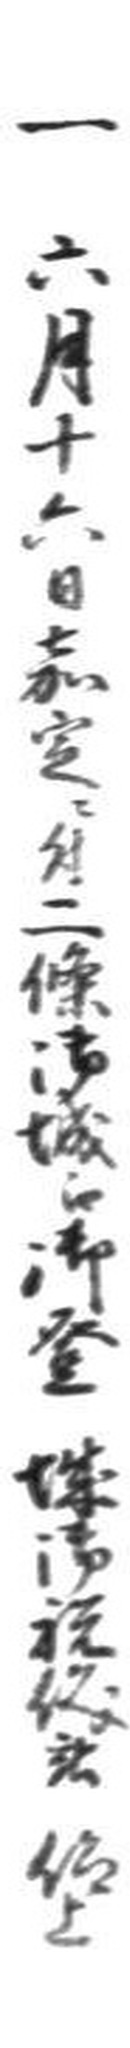一六月十六日嘉定ニ付二條御城江御登城御祝儀被仰上
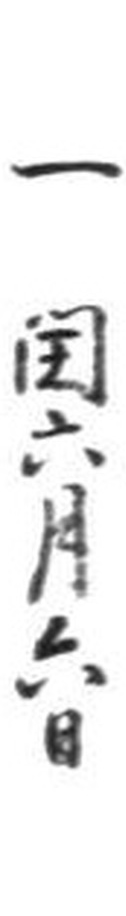一閏六月六日
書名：家譜 二 忠直公 従文禄四年到慶安四年
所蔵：福井県文書館 Fukui Prefectural Archives
